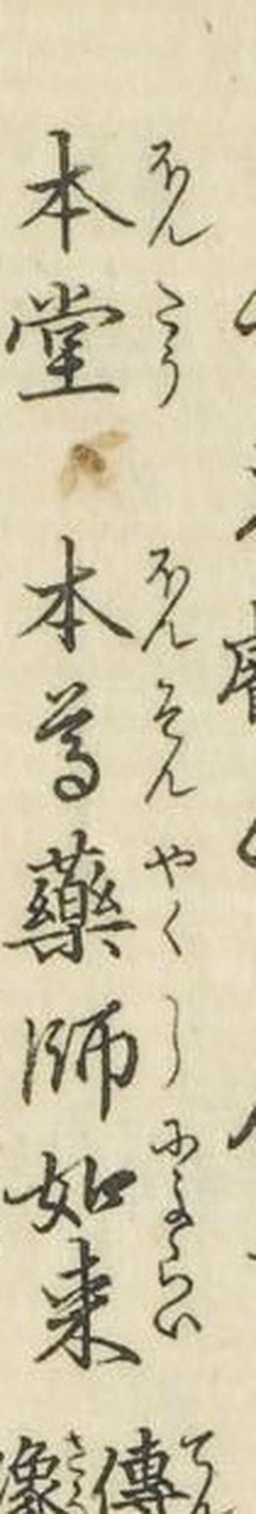本堂本尊薬師如来
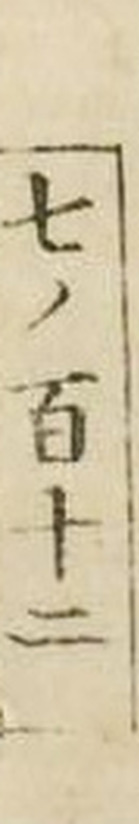七ノ百十二
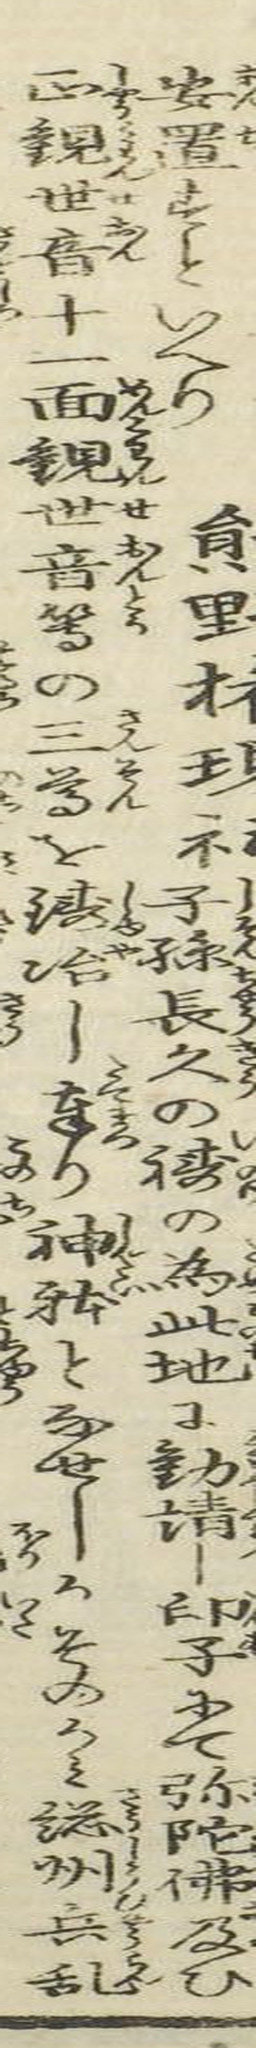正観世音十一面観世音等の三尊を鋳冶し奉り神体となせしかそのかみ相州兵乱
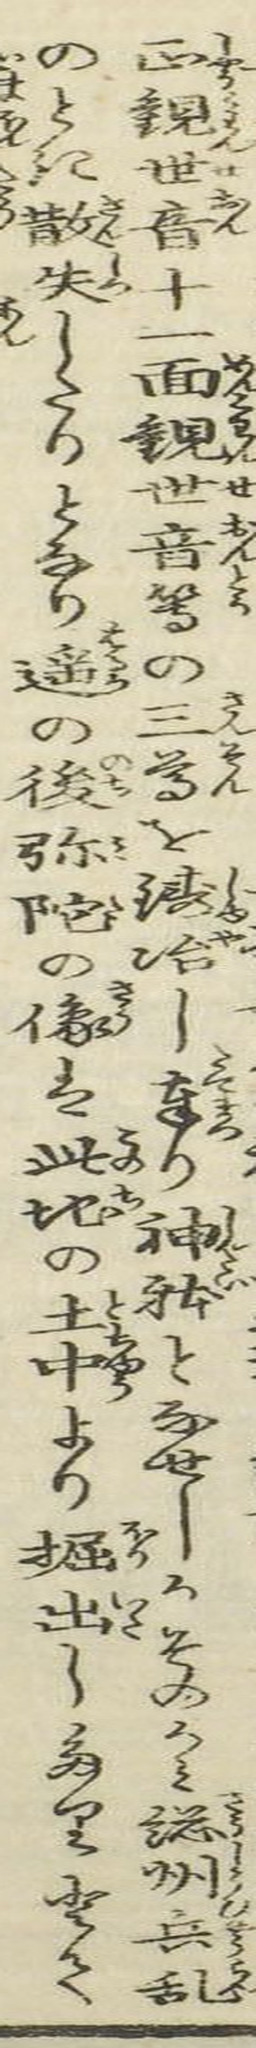のとき散失したりとなり遙の後弥陀の像は此地の土中より掘出したりとて
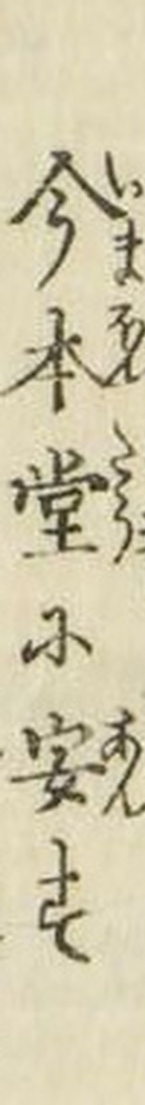今本堂に安す
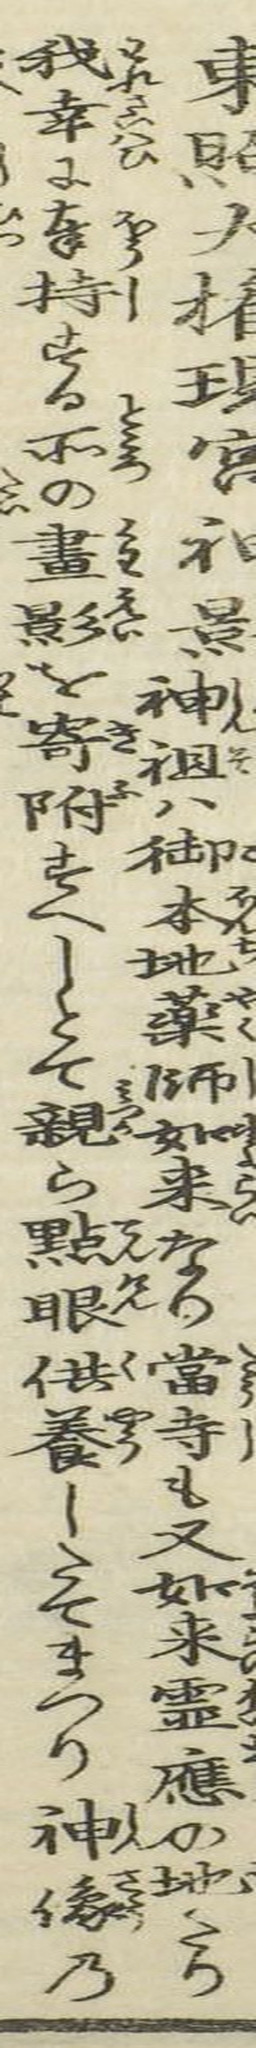我幸に奉持する所の画影を寄附すへしとて親ら点眼供養したてまつり神像の
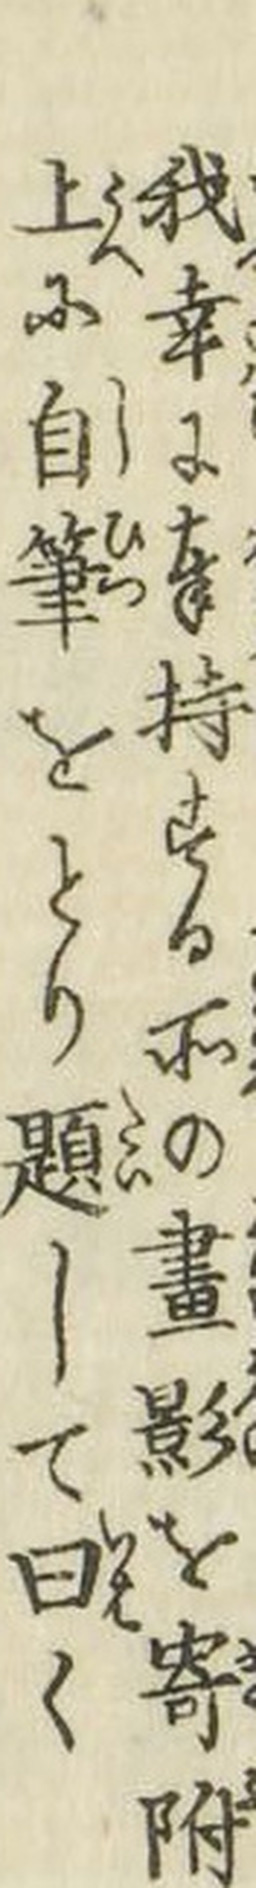上に自筆をとり題して曰く
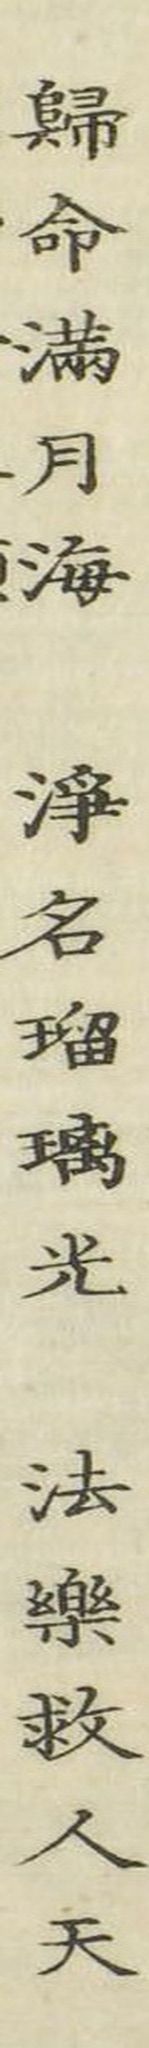帰命満月海浄名瑠璃光法楽救人天
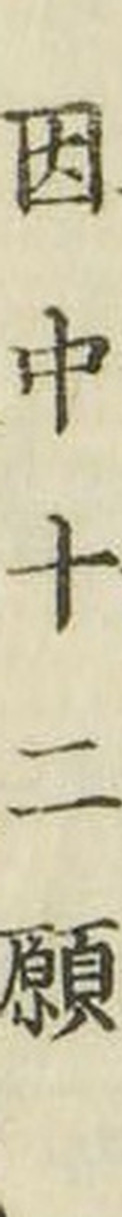因中十二願
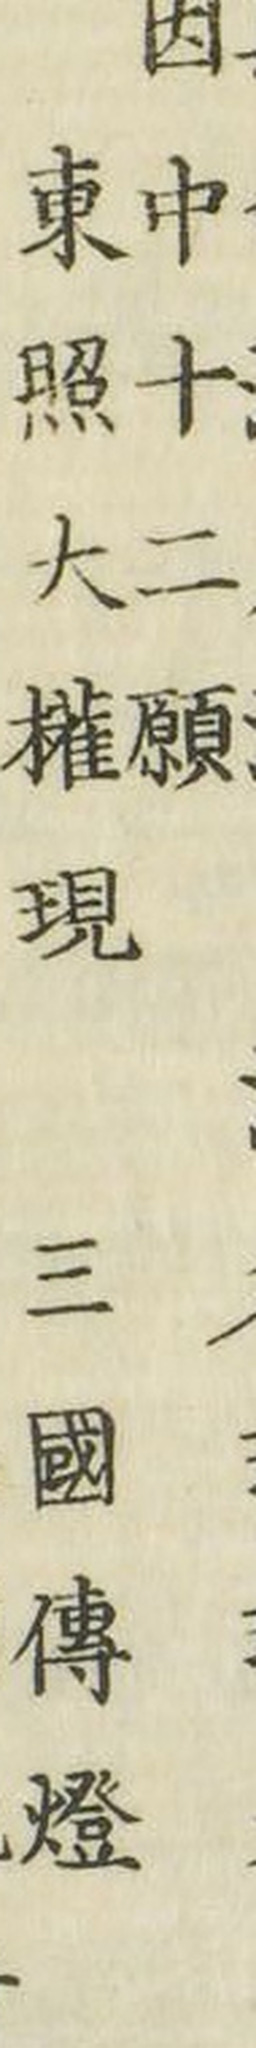東照大権現三国伝灯
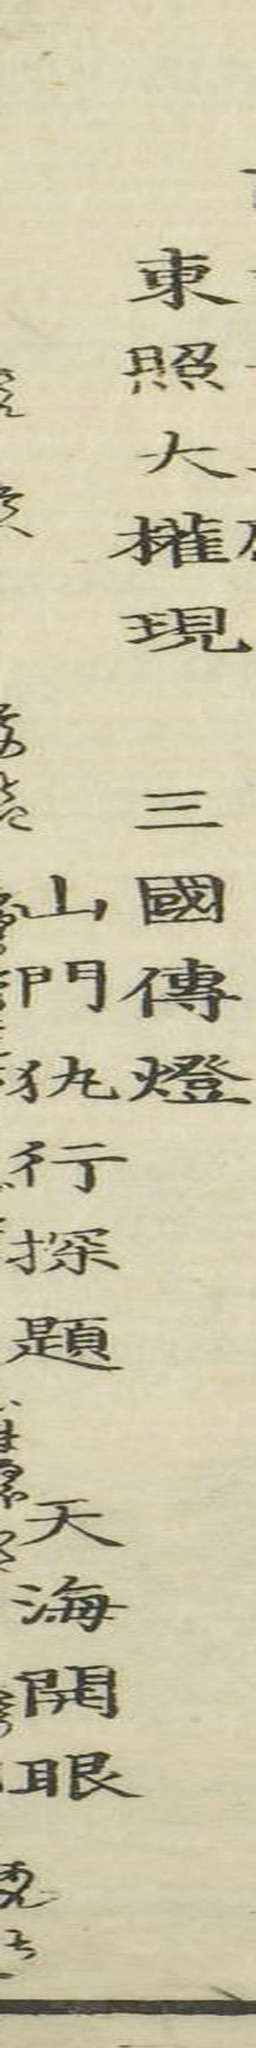山門執行探題天海開眼
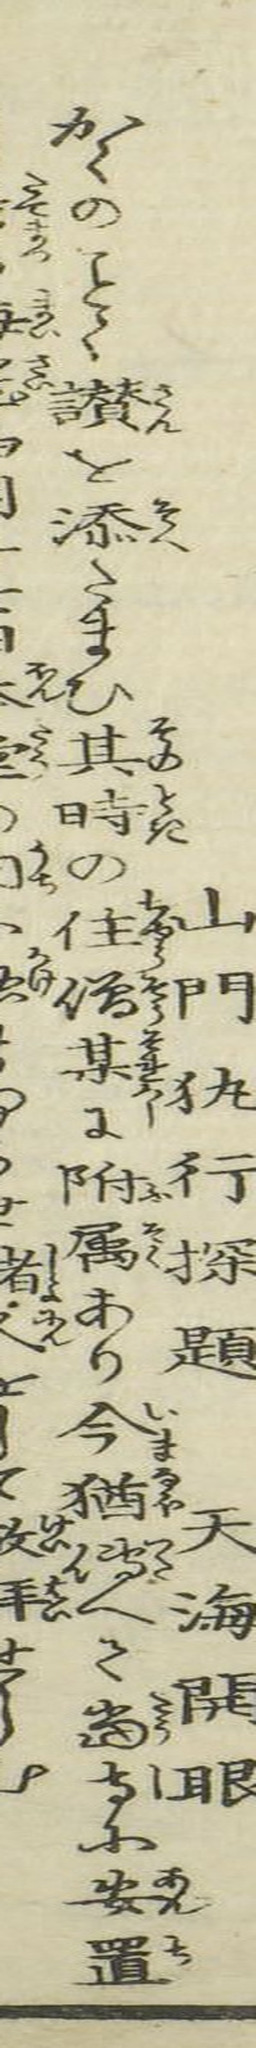かくのことて讃を添たまひ其時の住僧某に附属あり今猶伝へて当寺に安置
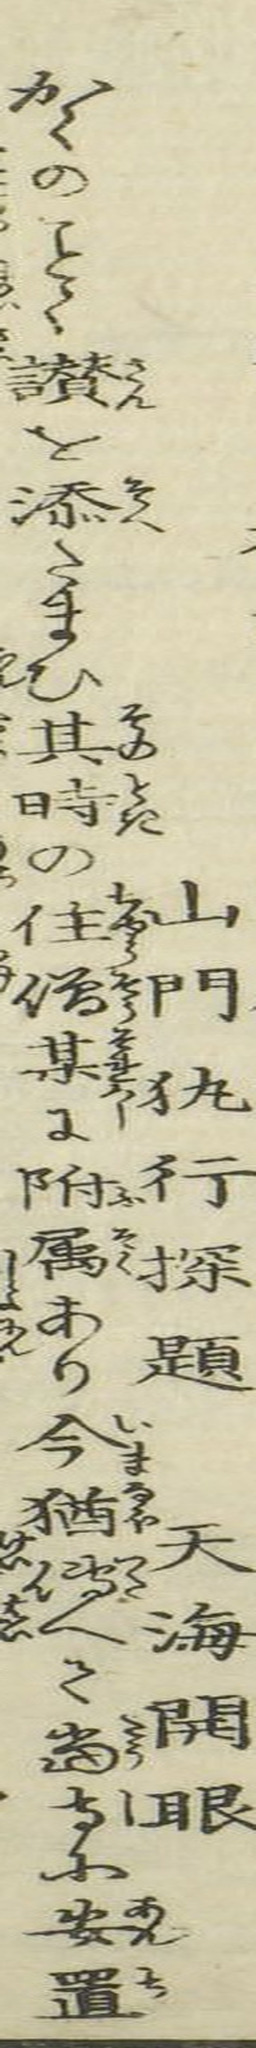かくのことて讃を添たまひ其時の住僧某に附属あり今猶伝へて当寺に安置
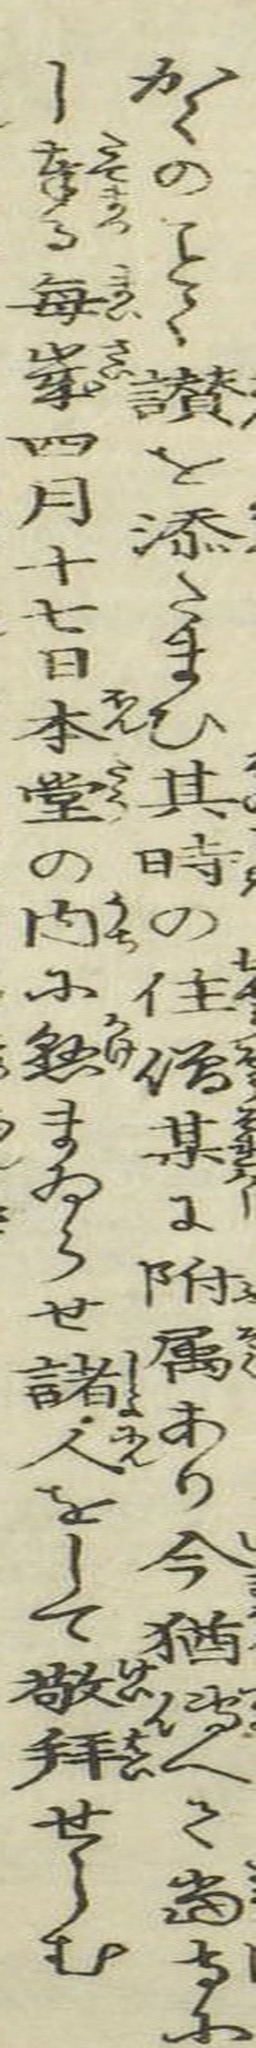し奉る毎歳四月十七日本堂の内に懸まゐらせ諸人をして敬拝せしむ
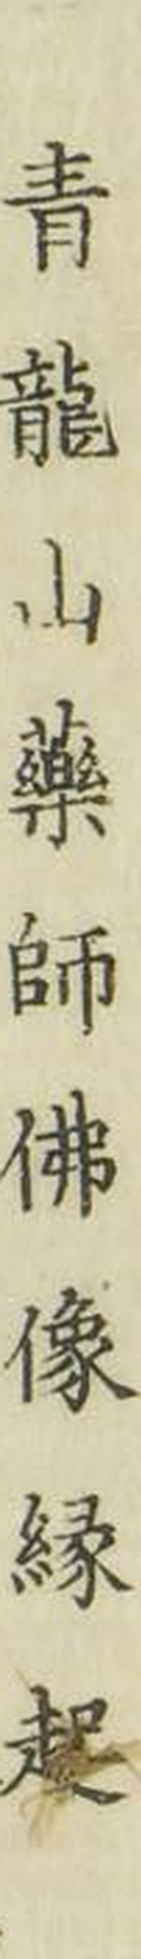青竜山薬師仏像縁起
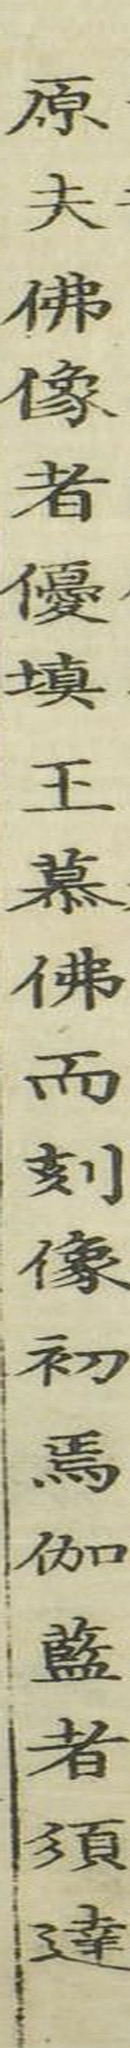原夫仏像者優填王慕佛而刻像初焉伽藍者須達
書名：江戸名所図会 20巻 巻之19
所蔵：東京学芸大学教育コンテンツアーカイブ
